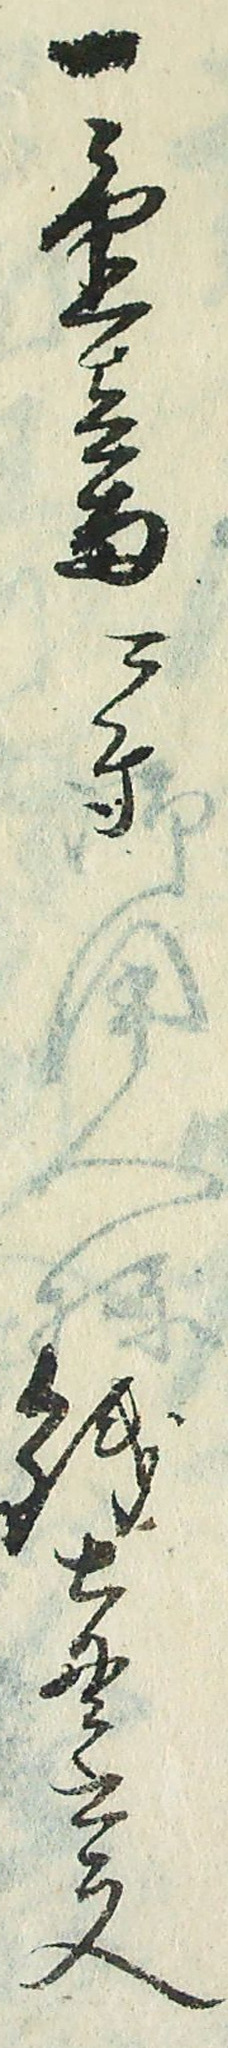一金壱両に付銭七貫六文
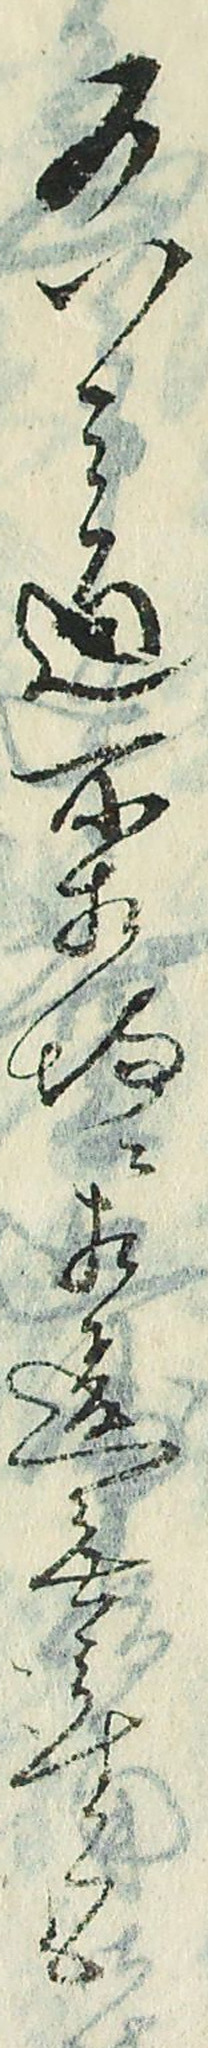右之通所相場に相違無御座候以上
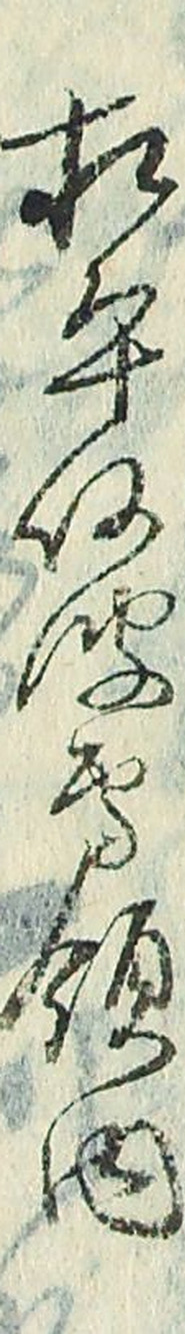松平阿波守領内
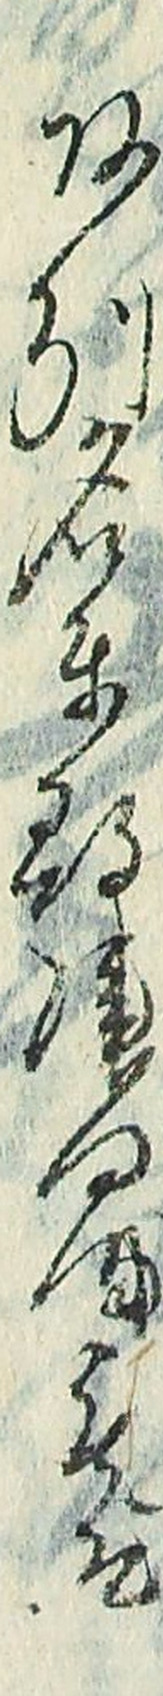阿州名東郡津田浦庄屋
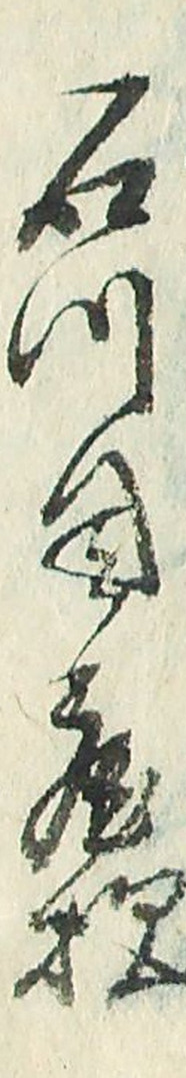石川周蔵様

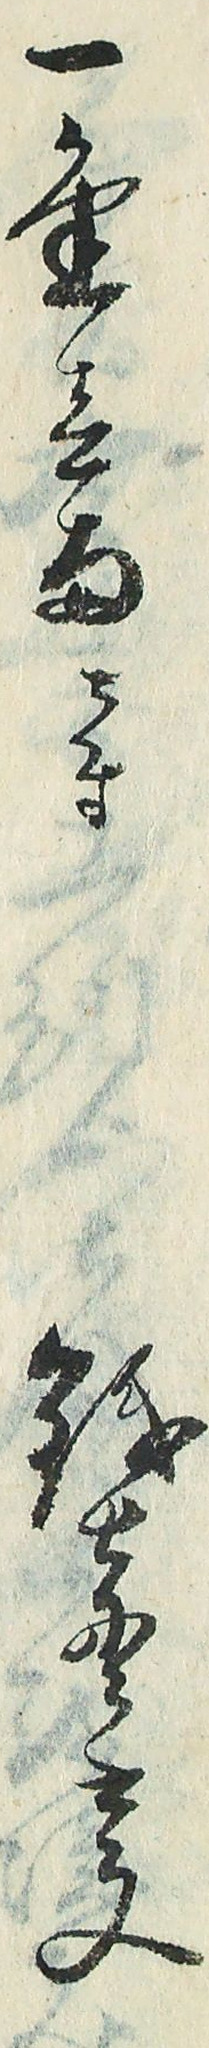一金壱両に付銭七貫六文
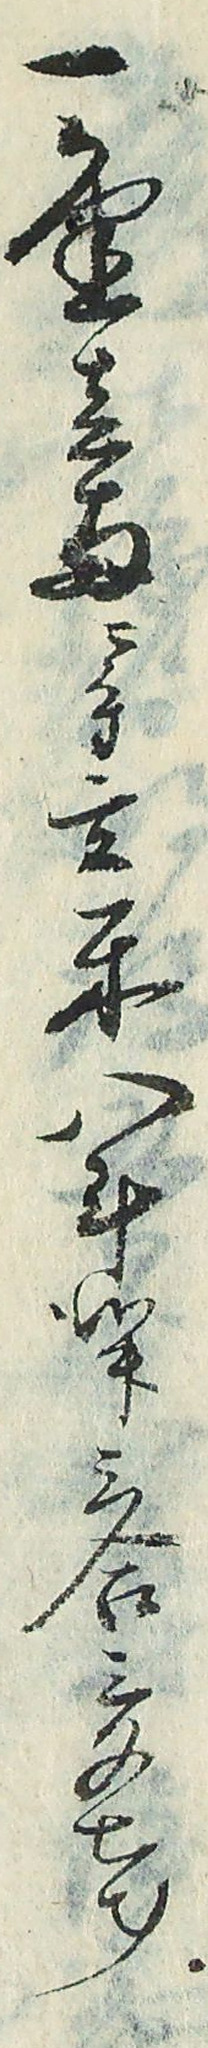一金壱両に付玄米八斗弐升三合三勺七才
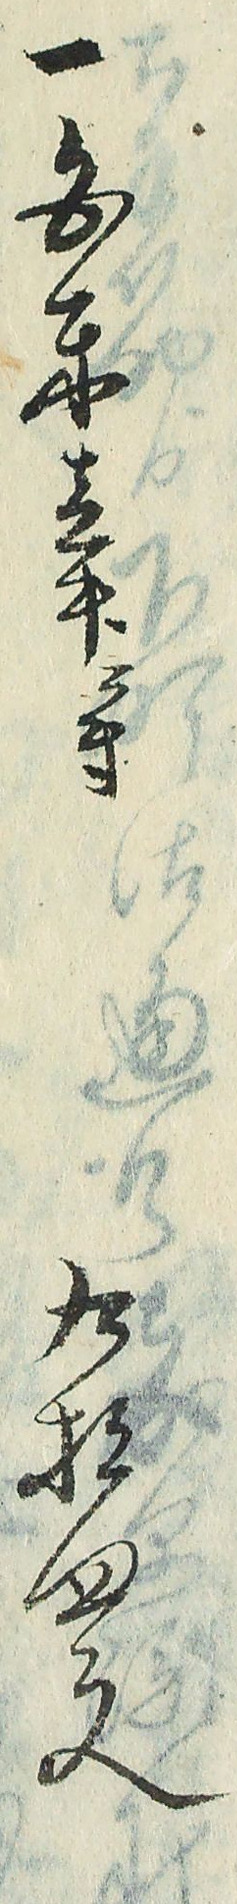一白米壱升に付九拾四文
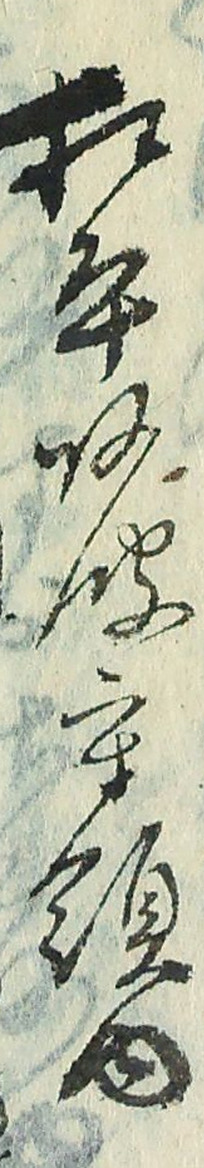松平阿波守領内
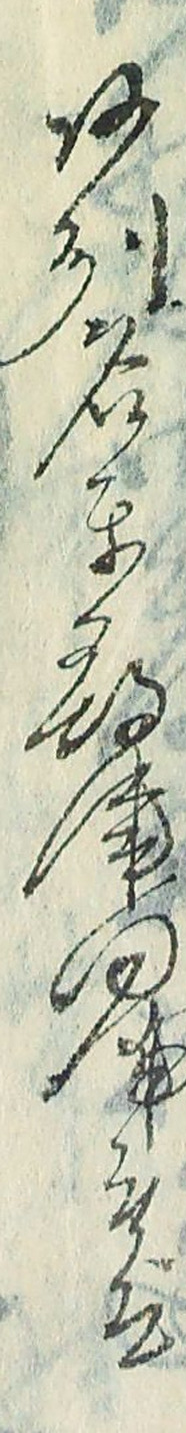阿州名東郡津田浦庄屋
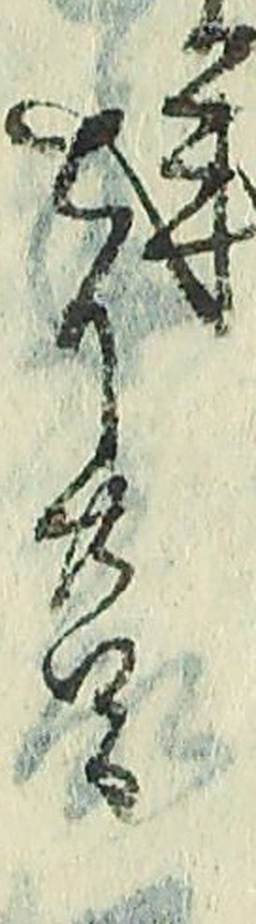七月廿四日
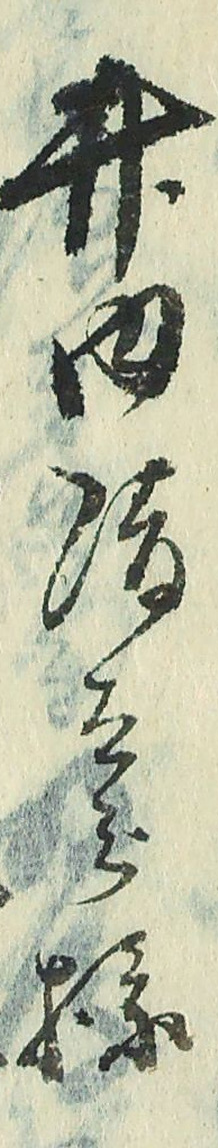竹内清太郎様
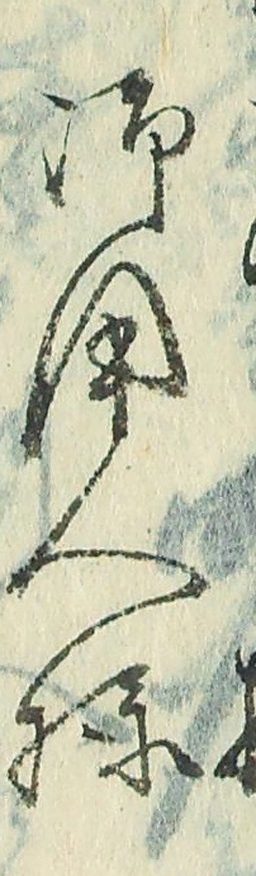御用人様
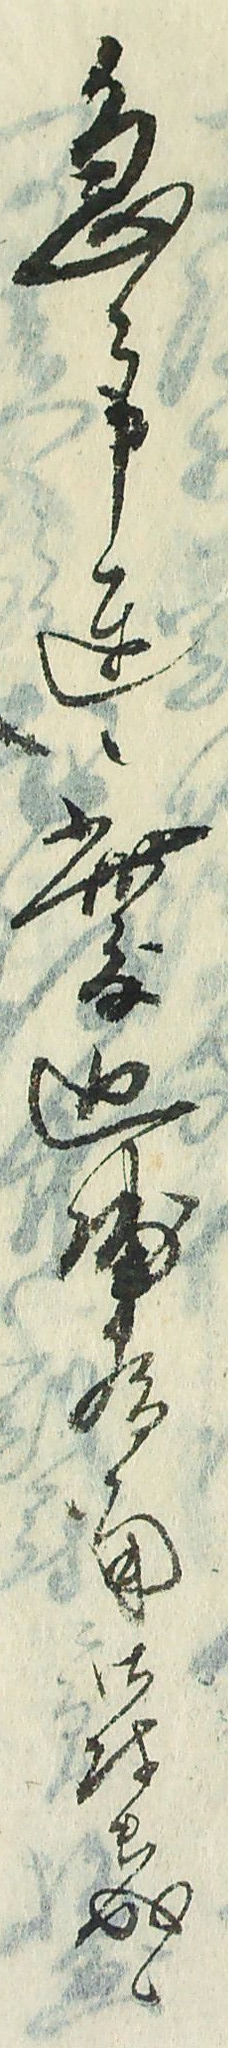急々申達候此度廻浦為御用御越被成候
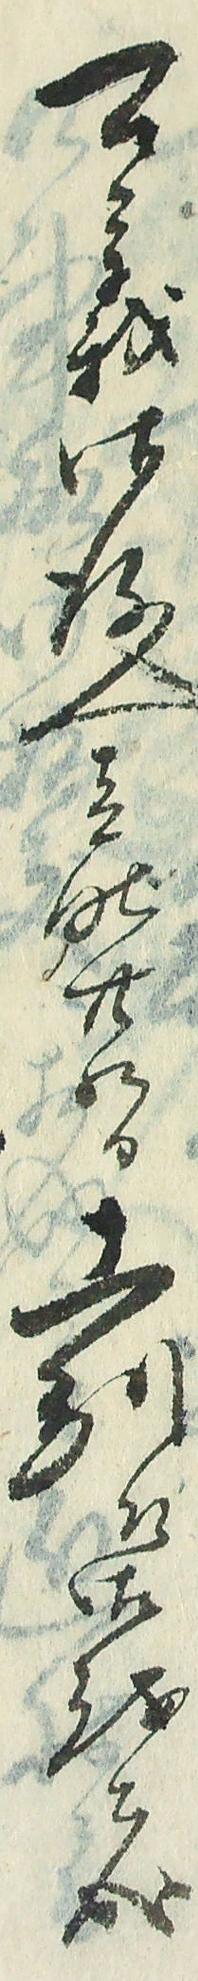公義御役人一昨廿九日土州え御越被成
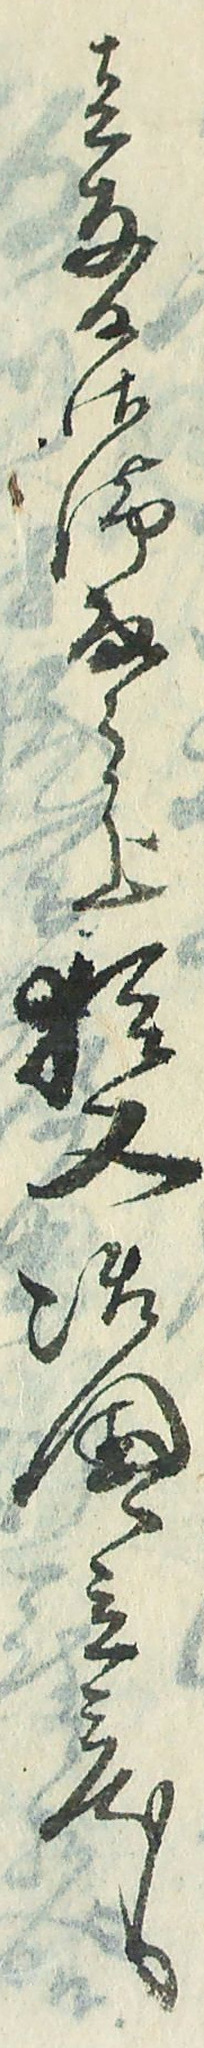壱両日御滞留之上猶又御国へ立戻り
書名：公辺御役人為御廻浦御立越諸御用一巻
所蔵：鳴門教育大学 Naruto University of Education
